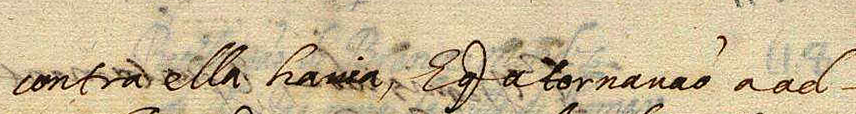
contra ella hauia, E q̄ a tornauaõ a ad
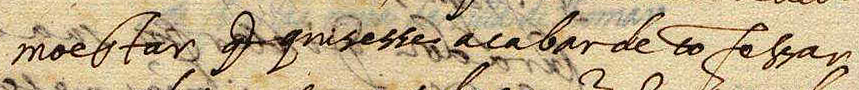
moestar q̄ quisesse acabar de cōfessar
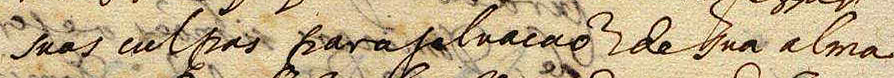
suas culpas para saluaçaõ de sua alma
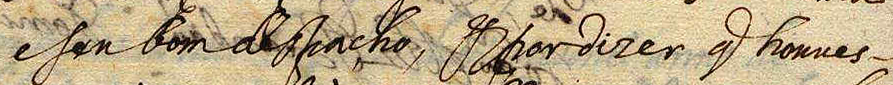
e seu bom despacho, & por dizer q̄ houues
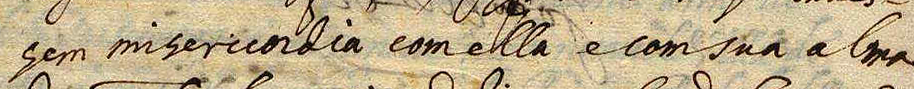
sem misericordia com ellla e com sua alma
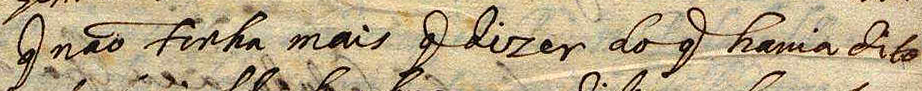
q̄ naõ tinha mais q̄ dizer do q̄ hauia dito
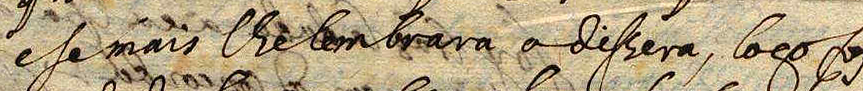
e se mais lhe lembrara o dissera, logo foy
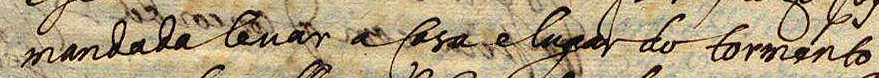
mandada leuar a Casa e lugar do tormento
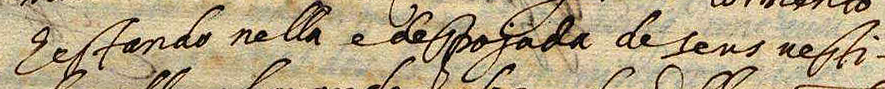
E estando nella e despojada de seus uesti
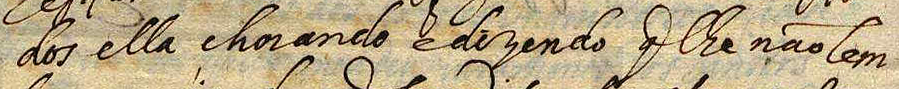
dos ella chorando e dizendo q̄ lhe não lem
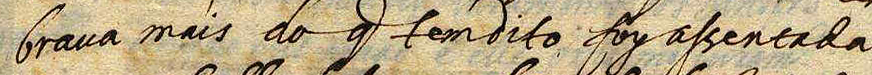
braua mais do q̄ tem dito foy assentada
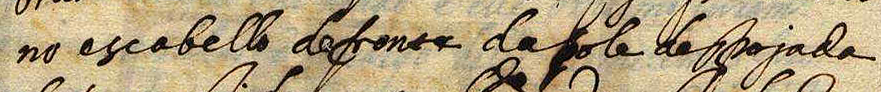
no escabello defronte da pole despojada
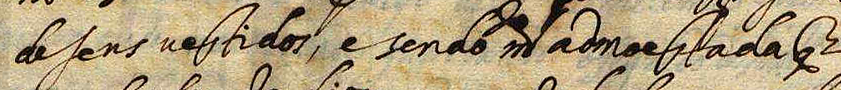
de seus uestidos, e sendo mto admoestada q̄
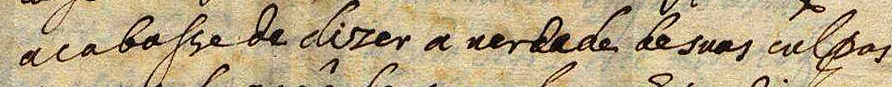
acabasse de dizer a uerdade de suas culpas
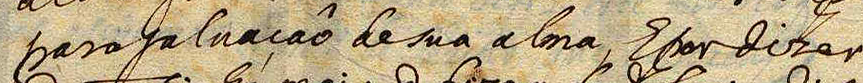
para saluaçaõ de sua alma, E por dizer
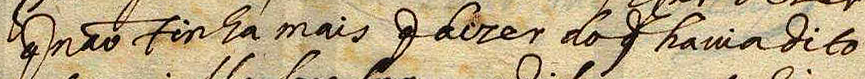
q̄ nao tinha mais q̄ dizer do q̄ hauia dito
